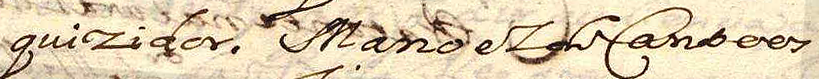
quizidor. Manoel do Canto o es
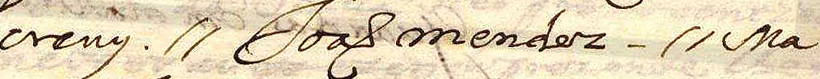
creuy. // João mendez - // Ma
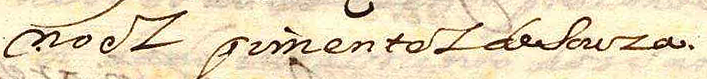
noeL pimenteL de Souza.
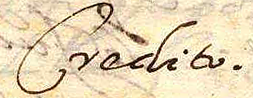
Credito.
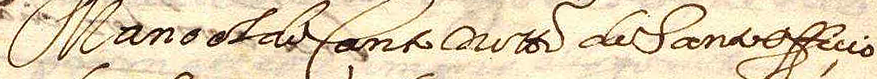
ManoeL do Canto notto do Santo offiçio
